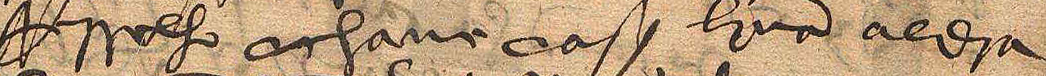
fferrolho e chaue e asy huā aldra
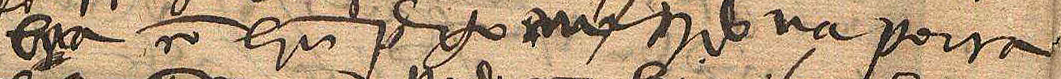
baa c̄o hū p̄go metjdo na porta
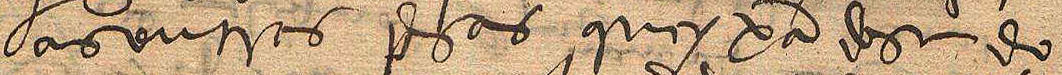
as outras p̄sas queyxādose do
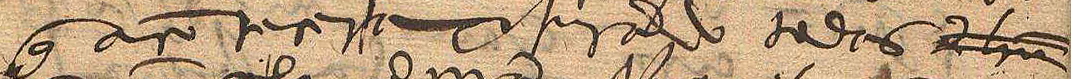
q̄ ac̄otecera e Jurādo todas ē hū
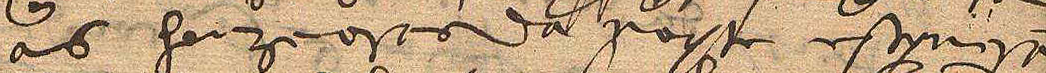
as honze oras da noyte estyuerā
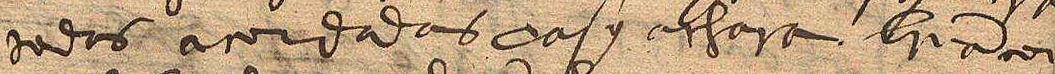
todas acordadas e asy achara huā cor
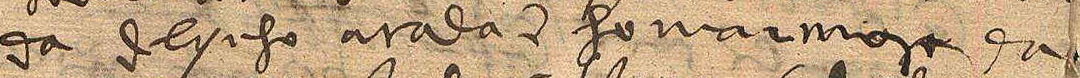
da de lynho atada ē ho marmore da
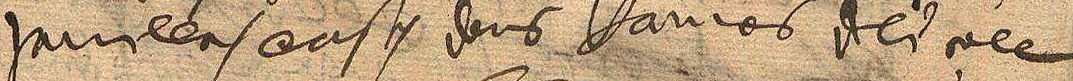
Janella / e asy dous Ramos de lēçoll
